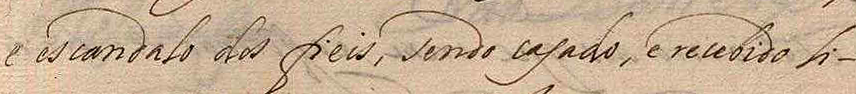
e escandalo dos fieis, sendo casado, e recebido li
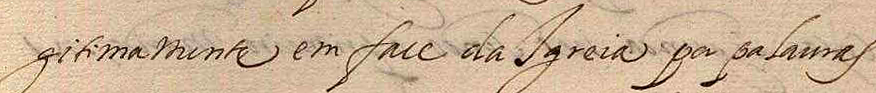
gitimamente em face da Igreia por palauras
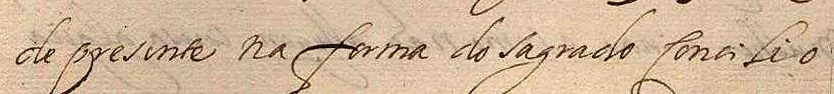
de presente na forma do sagrado Concilio
